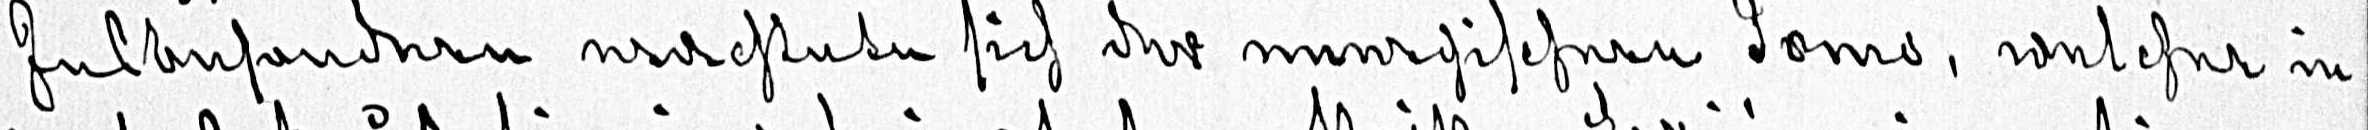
Insbesondere erachtete sich der energischere Tomo, welcher in
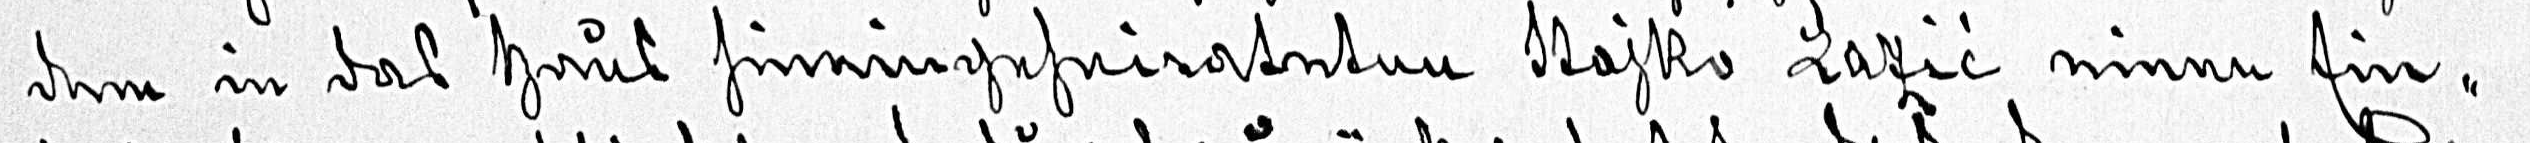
dem in das Haus Hineingeheirateten Stojko Lazić einen Ein¬
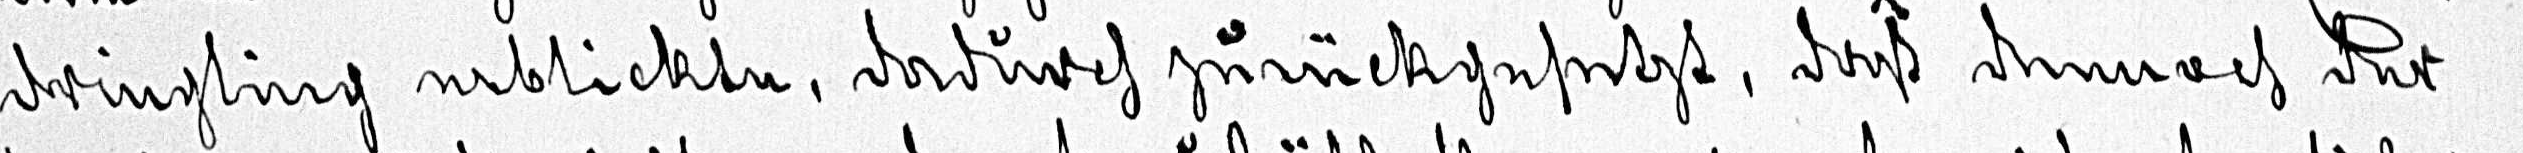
dringling erblickte, dadurch zurückgesetzt, daß danach der
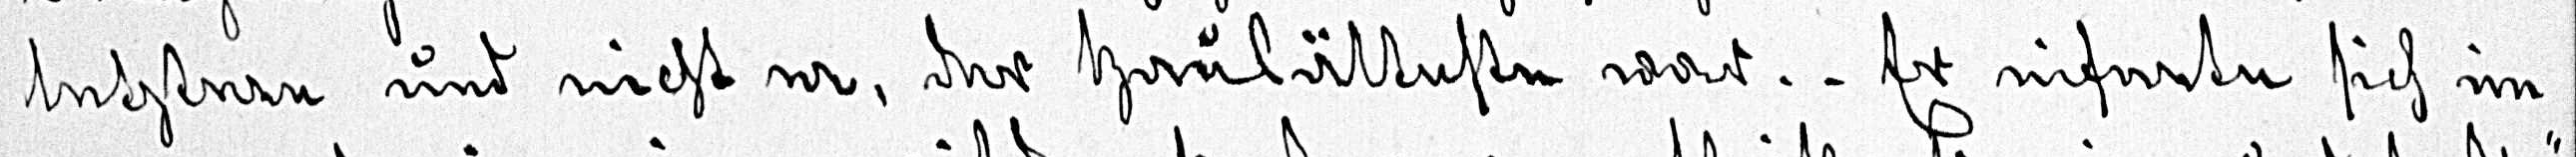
letztere und nicht er, der Hausälteste war. - Er eiferte sich im¬
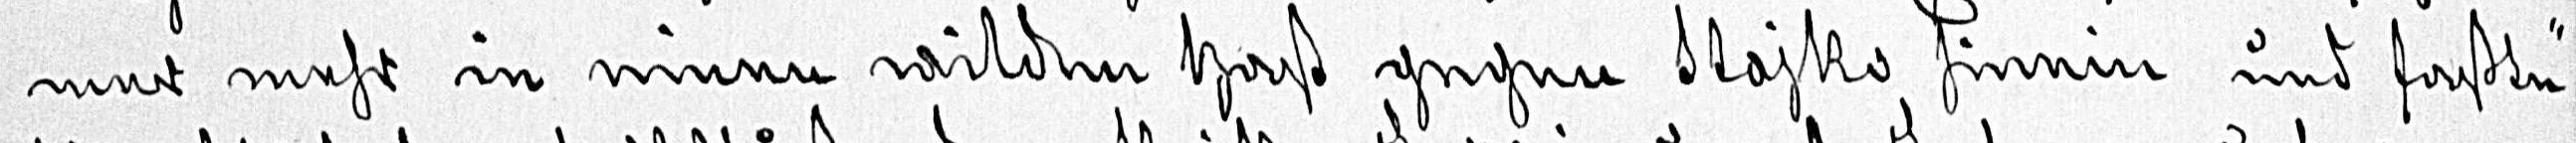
mer mehr in einen wilden Haß gegen Stojko hinein und faßte¬
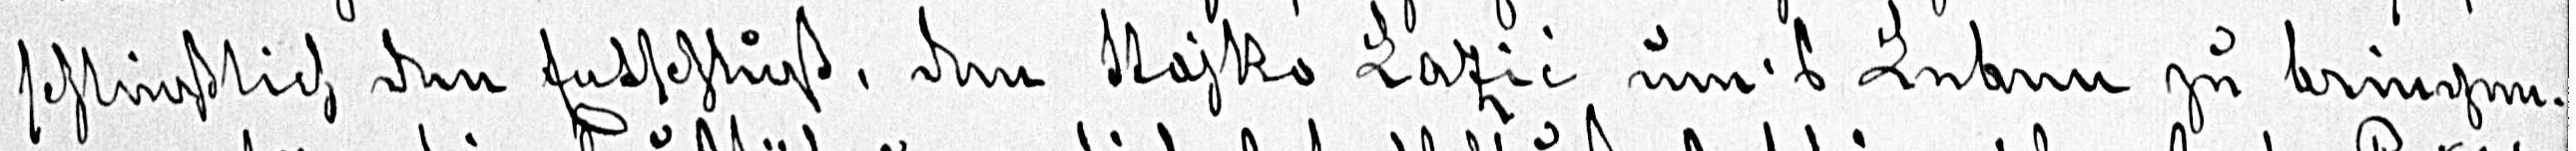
schließlich den Entschluß, den Stojko Lazić um’s Leben zu bringen.
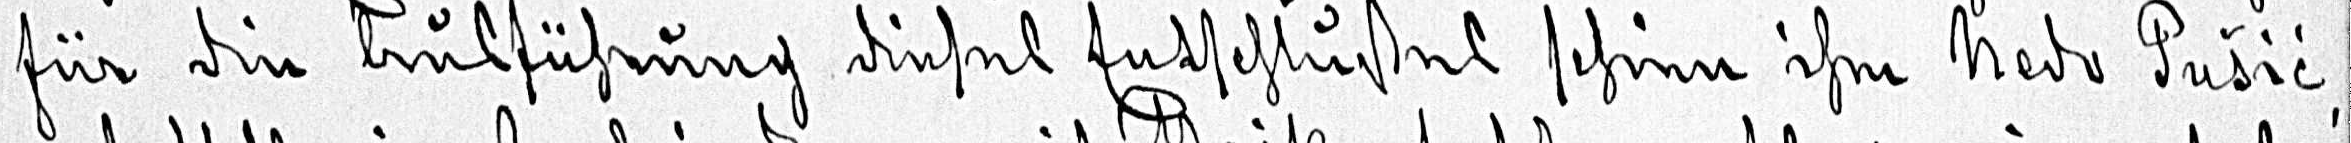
Für die Ausführung dieses Entschlußes schien ihm Nedo Pušić,
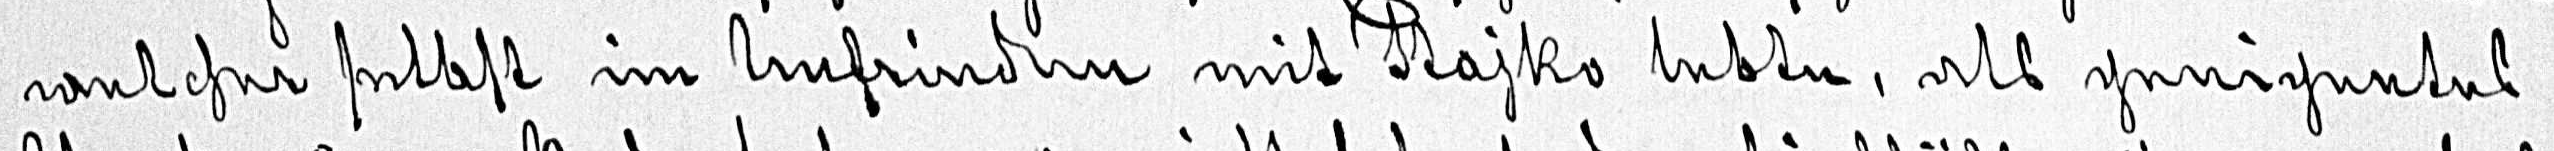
welcher selbst im Unfrieden mit Stojko lebte, als geeignetes
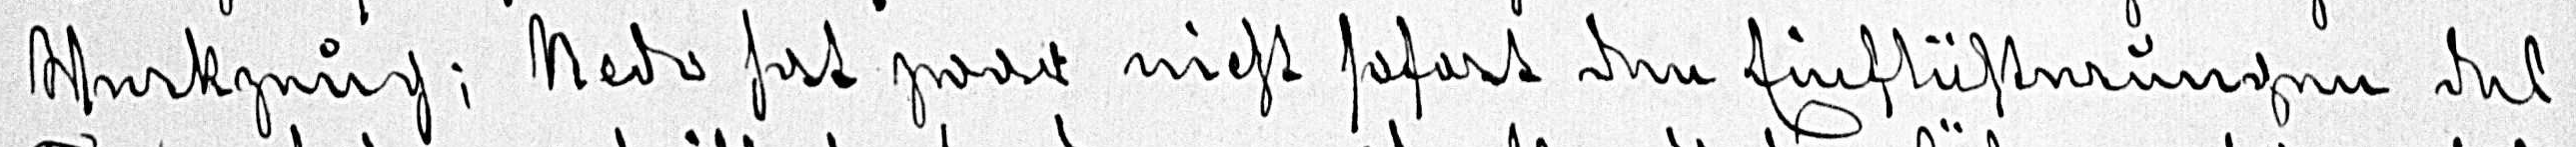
Werkzeug; Nedo hat zwar nicht sofort den Einflüsterungen des
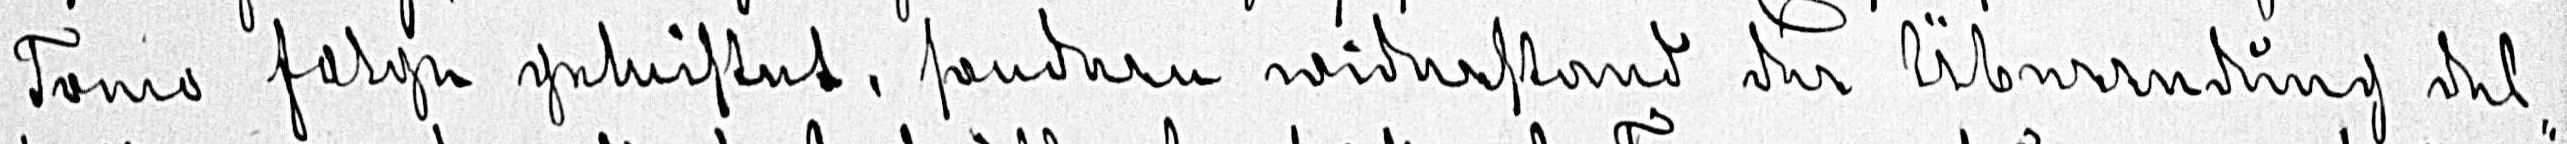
Tomo folge geleistet, sondern widerstand der Überredung des¬
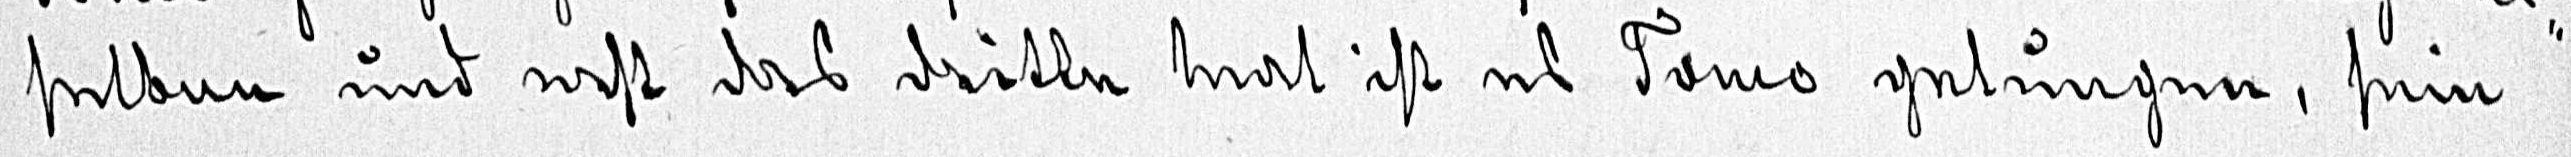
selben und erst das dritte Mal ist es Tomo gelungen, sein
